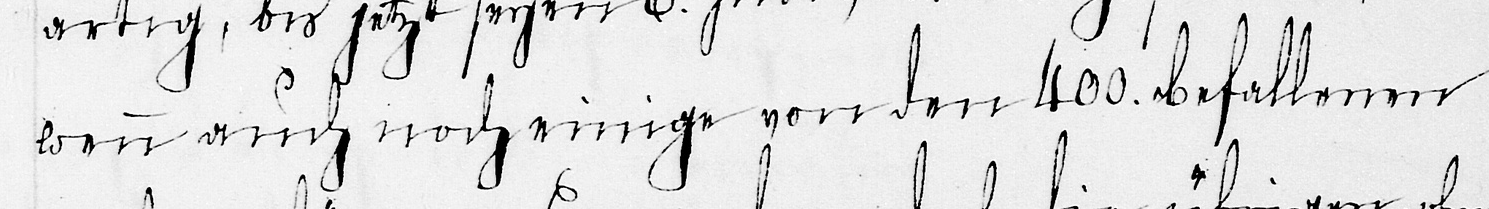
wenn auch noch einige von den 400. Befallenen
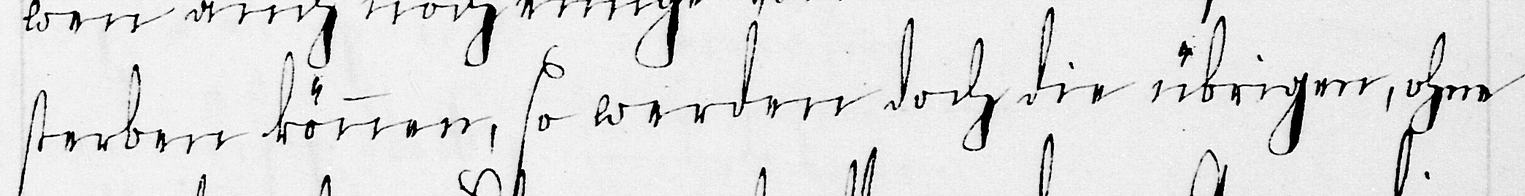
sterben können, so werden doch die übrigen, ohne
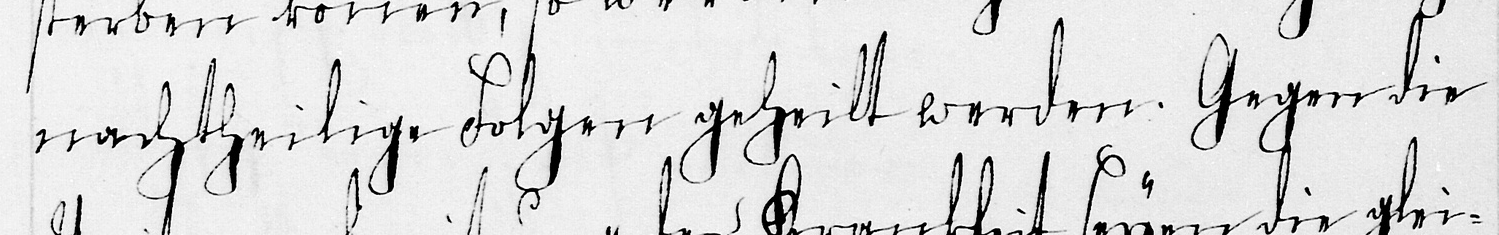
nachtheilige Folgen geheilt werden. Gegen die
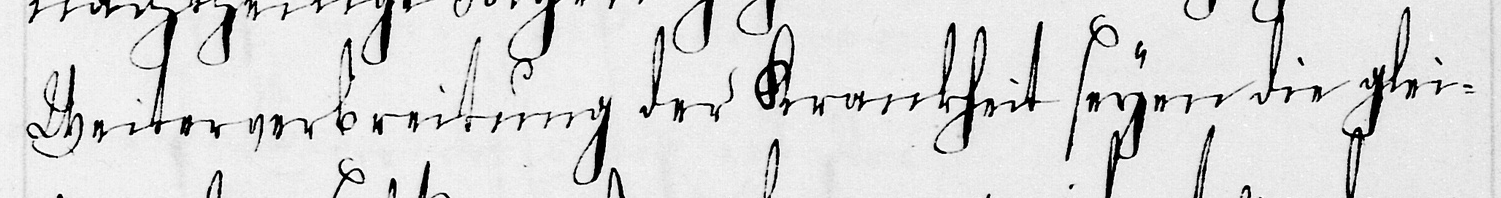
Weiterverbreitung der Krankheit seyen die glei¬
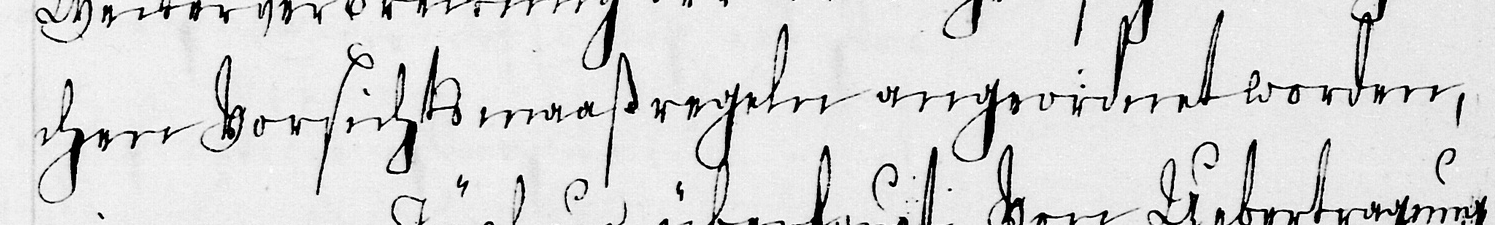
chen Vorsichtsmaaßregeln angeordnet worden,
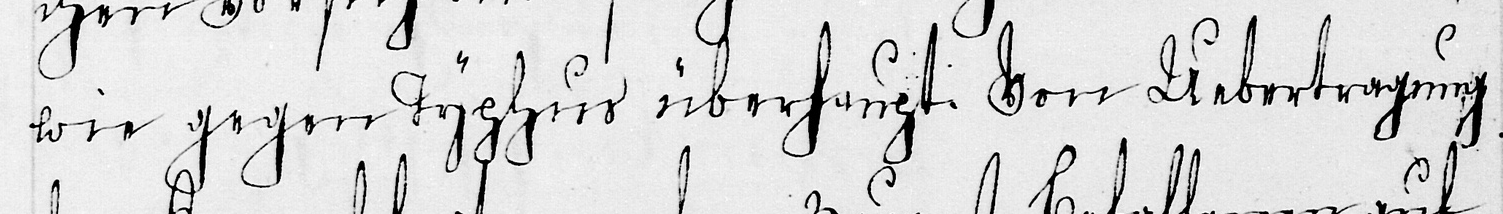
wie gegen Typhus überhaupt. Von Uebertragung
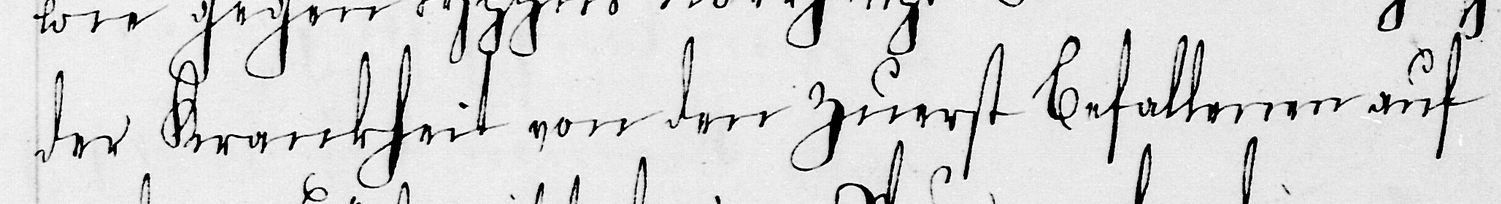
der Krankheit von den zuerst Befallenen auf
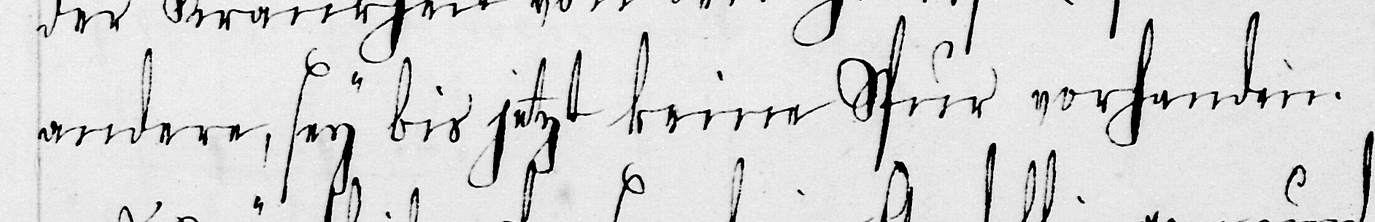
andere, sey bis jetzt keine Spur vorhanden.
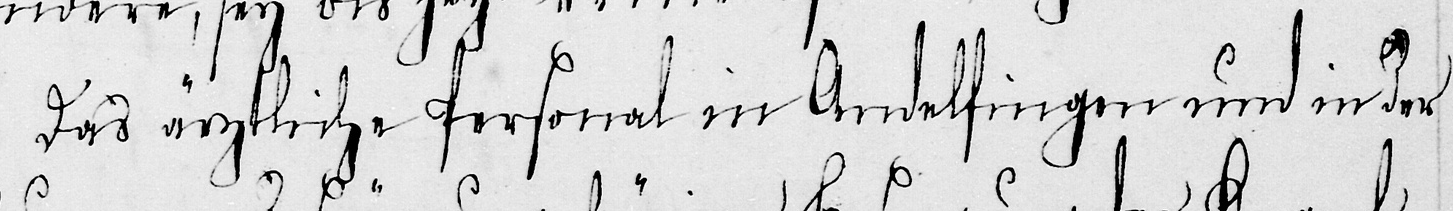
Das ärztliche Personal in Andelfingen und in der
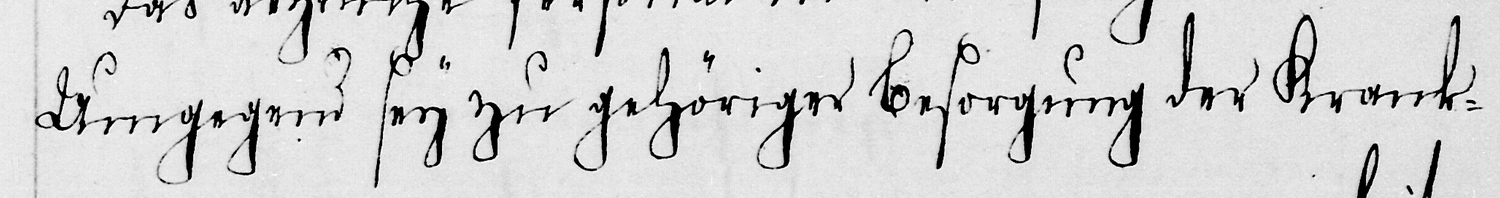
Umgegend sey zu gehöriger Besorgung der Krank-
